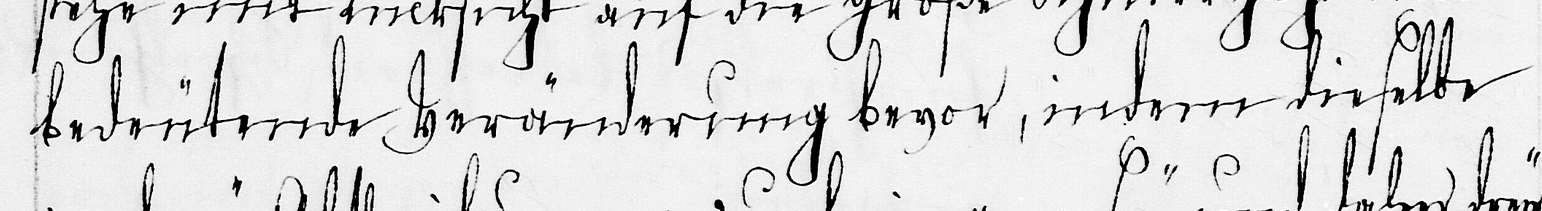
bedeutende Veränderung bevor, indem dieselbe
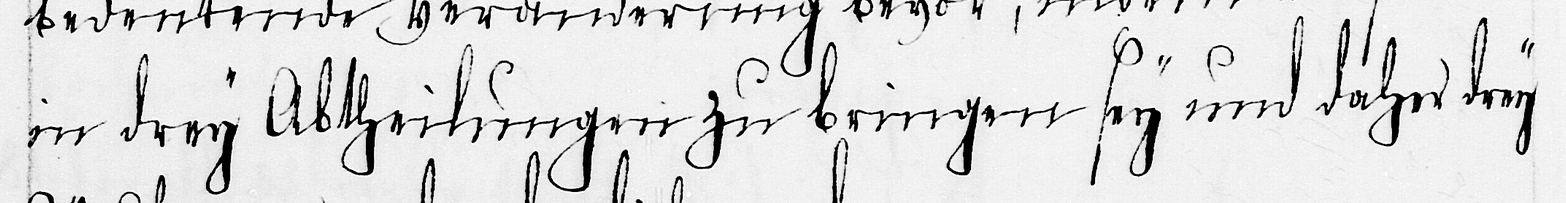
in drey Abtheilungen zu bringen sey und daher drey
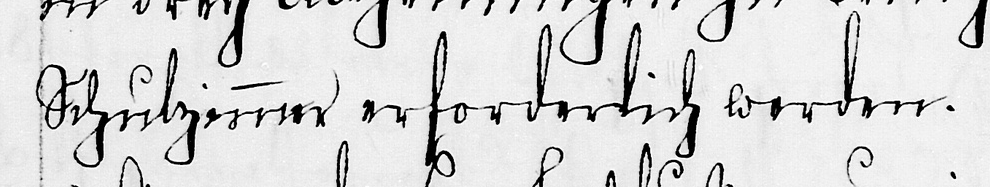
Schulzimmer erforderlich werden.
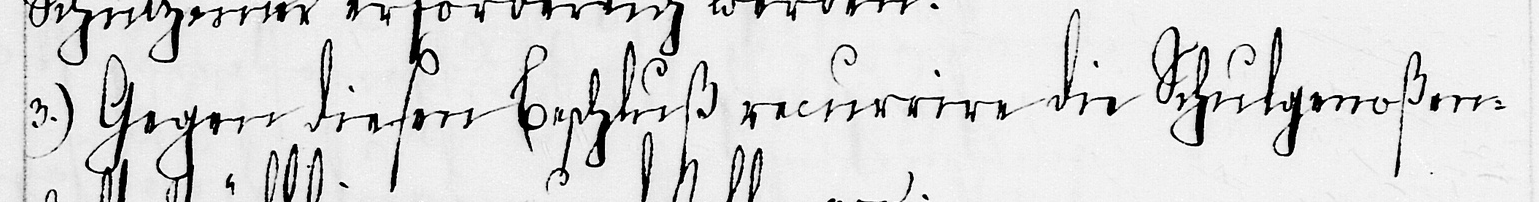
3.) Gegen diesen Beschluß recurrire die Schulgenoßen¬
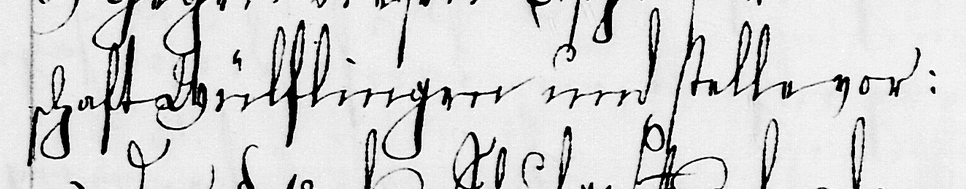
schaft Wülflingen und stelle vor:
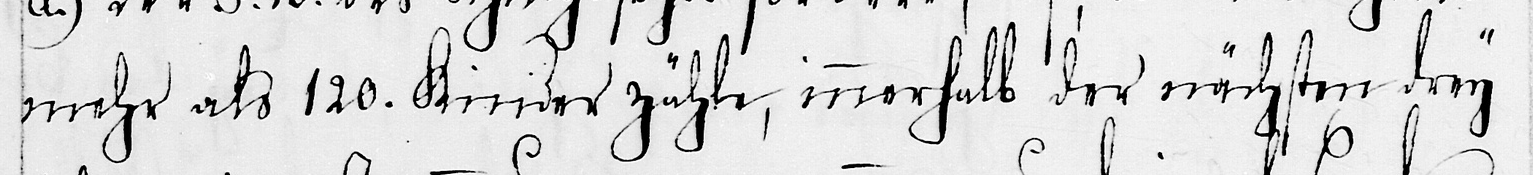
mehr als 120. Kinder zähle, innerhalb der nächsten drey
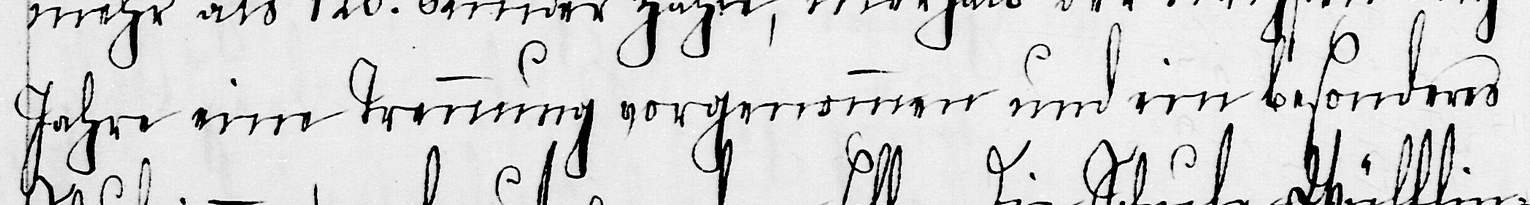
Jahre eine Trennung vorgenommen und ein besonderes
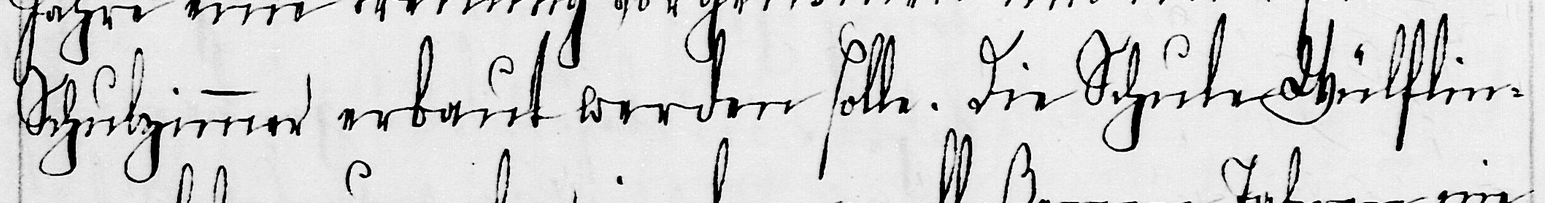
Schulzimmer erbaut werden solle. Die Schule Wülflin¬
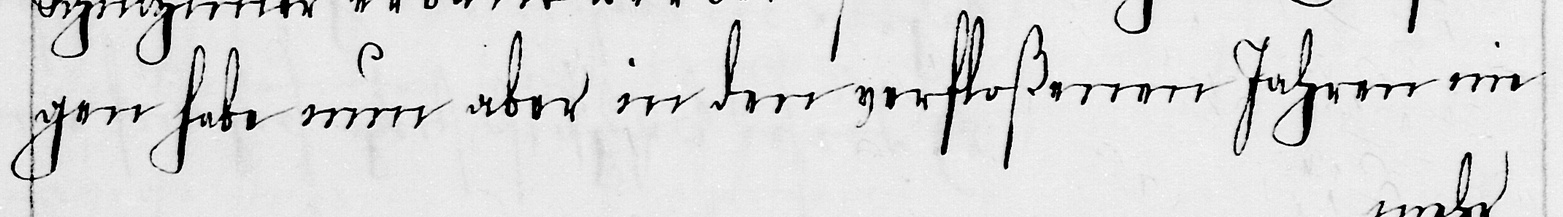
gen habe nun aber in den verfloßenen Jahren nie
